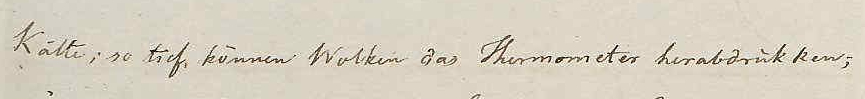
Kälte; so tief können Wolken das Thermometer herabdrükken;
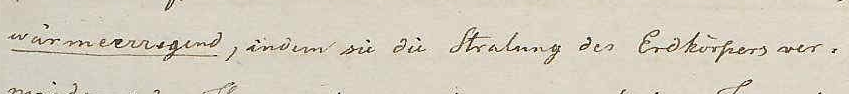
wärmeerregend, indem sie die Stralung des Erdkörpers ver-
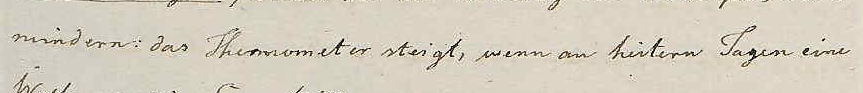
mindern: das Thermometer steigt, wenn an heitern Tagen eine
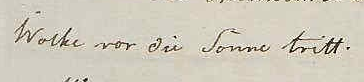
Wolke vor die Sonne tritt.
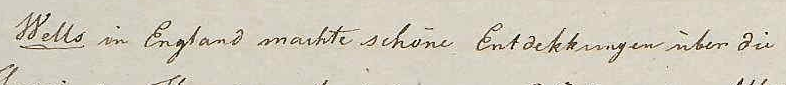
Wells in England machte schöne Entdekkungen über die
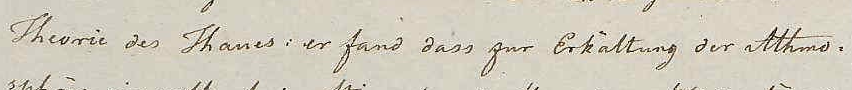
Theorie des Thaues: er fand dass zur Erkältung der Athmo-
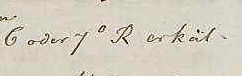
6 oder 7° R. erkäl-
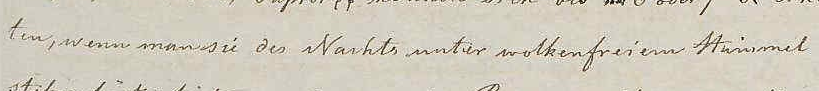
ten, wenn man sie des Nachts unter wolkenfreiem Himmel
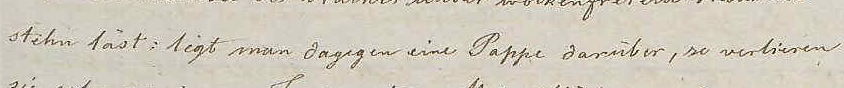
stehn läst: legt man dagegen eine Pappe darüber, so verlieren
